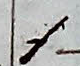1
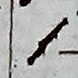1
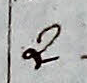2
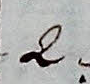2
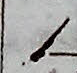1
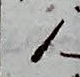1
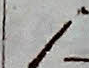1
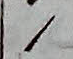1
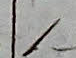1
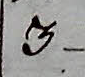3
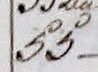55
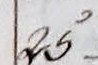25
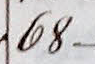68
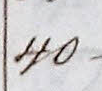40
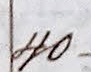40
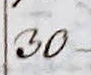30
